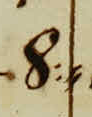8:
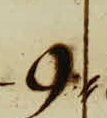9:
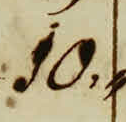10
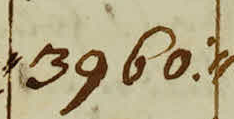3960.
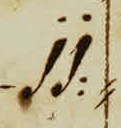11:
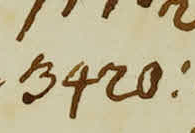3420
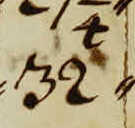32
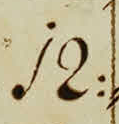12
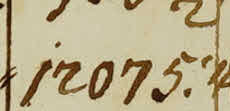12075.
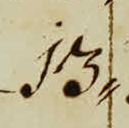13
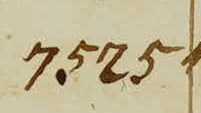7525
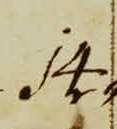14
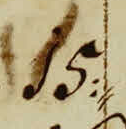15:
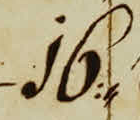16:
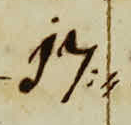17:
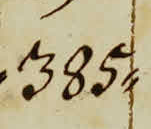385
